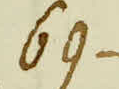69
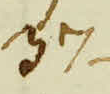37
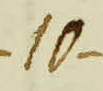10
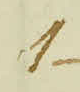1
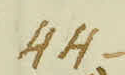44
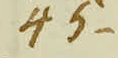45
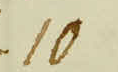10
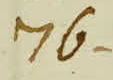76
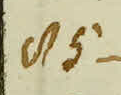85
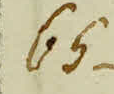65
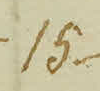15
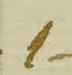1
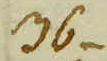36
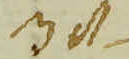38
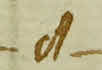8
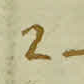2
